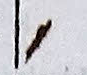1
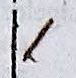1
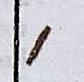1
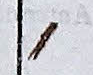1
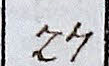27
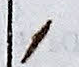1
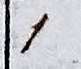1
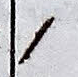1
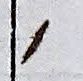1
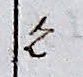2
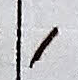1
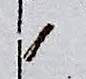1
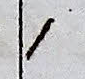1
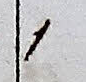1
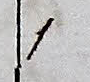1
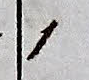1
